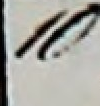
10
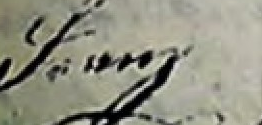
Franz
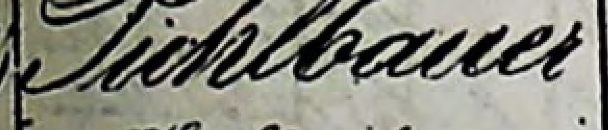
Pichlbauer
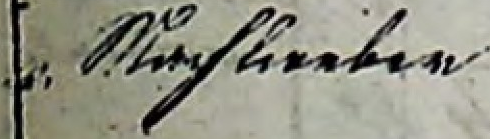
v. Machlweber
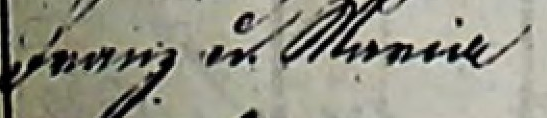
Franz u. Maria
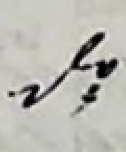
Do
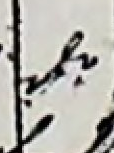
Do
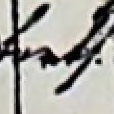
forts.
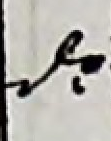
Do
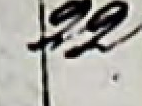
22
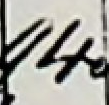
94
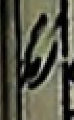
85
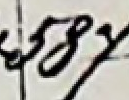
587
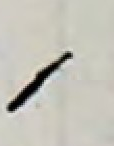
1
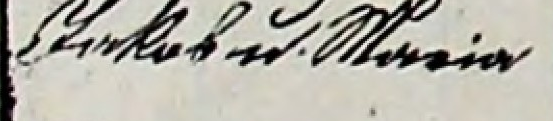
Jakob u. Maria
